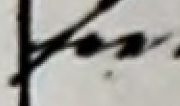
see
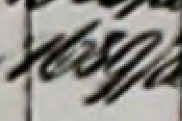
1689/a
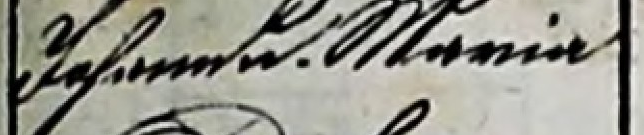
Johann u. Maria
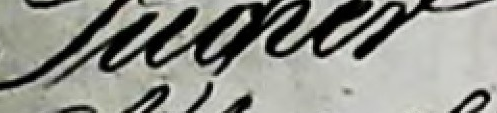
Pucher
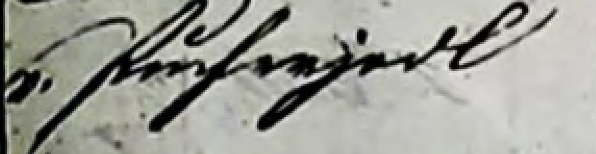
v. Pucherjodl
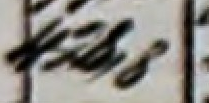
1128,8
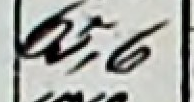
65,6
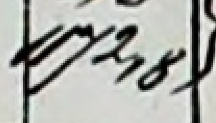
1172,8
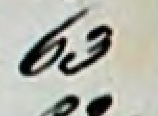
63
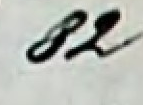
82
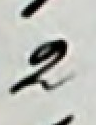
2
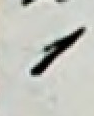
1
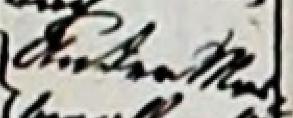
Unter Mar„
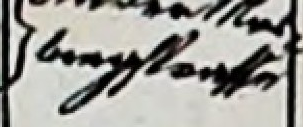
bergstraffe
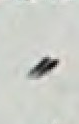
„
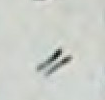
„
